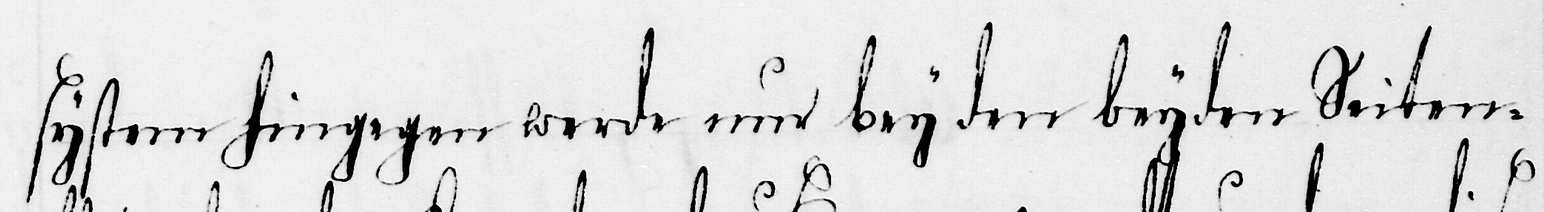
system hingegen werde nur bey den beyden Seiten¬
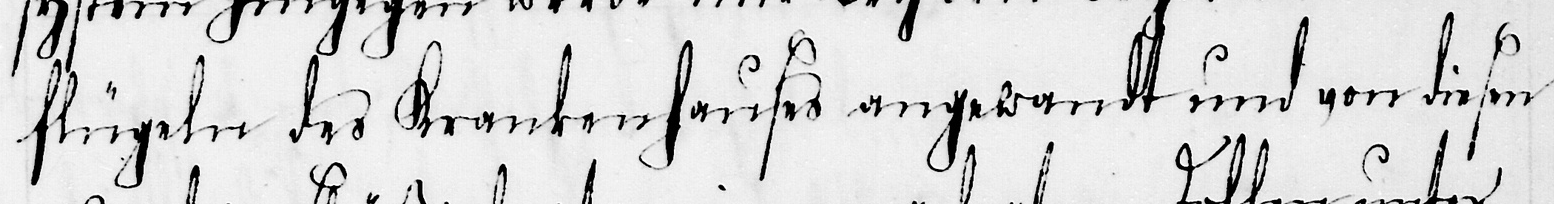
flügeln des Krankenhauses angewandt und von diesen
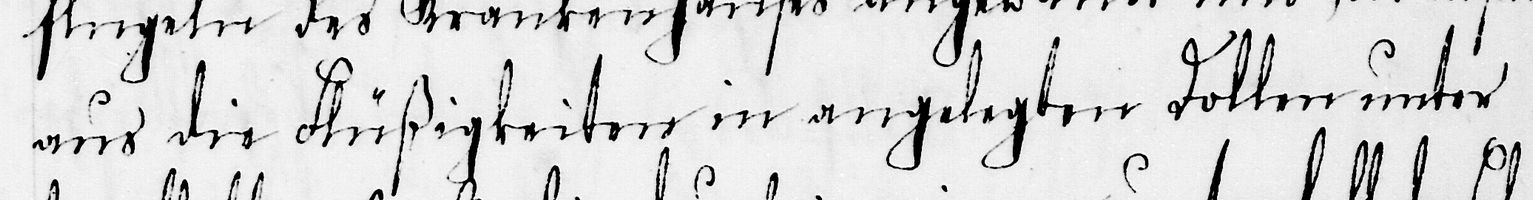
aus die Flüßigkeiten in angelegten Dollen unter
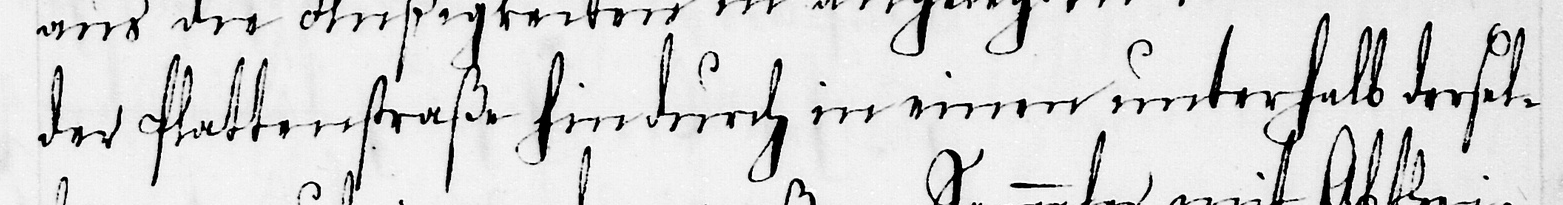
der Plattenstraße hindurch in einen unterhalb dersel¬
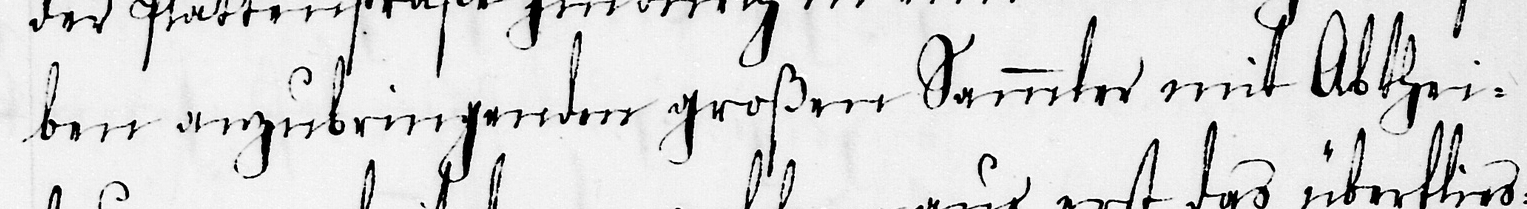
ben anzubringenden großen Sammler mit Abthei¬
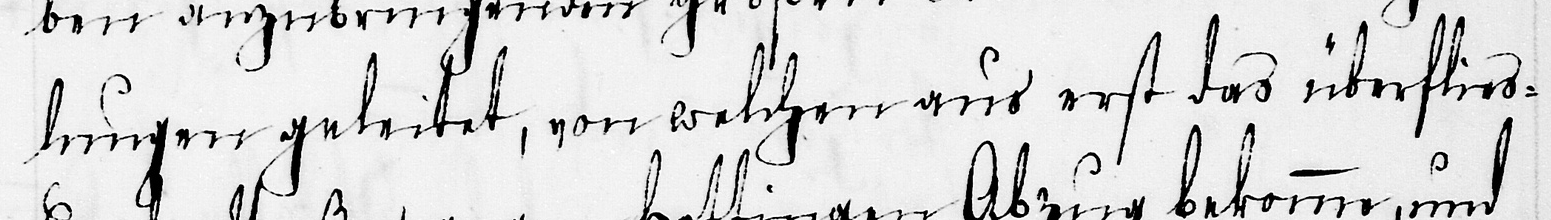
lungen geleitet, von welchen aus erst das überfließ¬
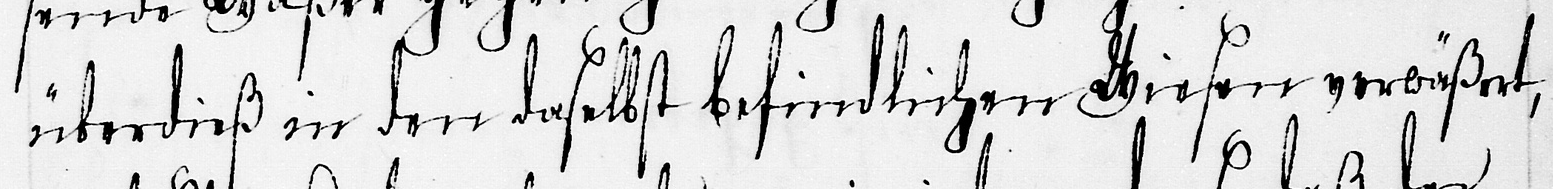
überdieß in den daselbst befindlichen Wiesen verwäßert,
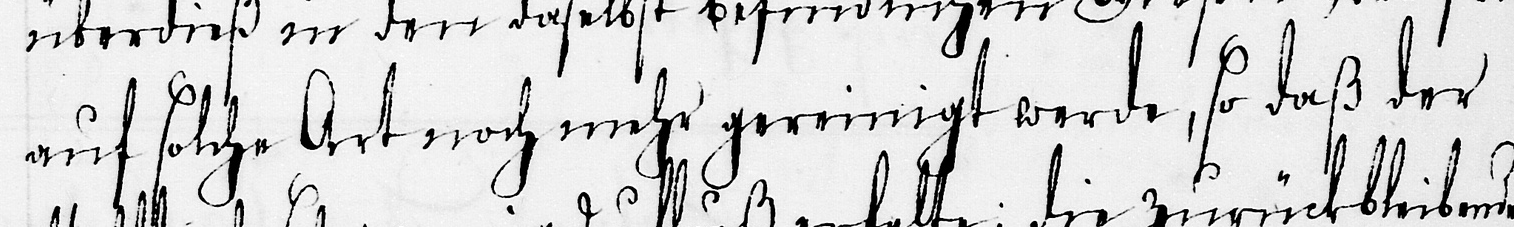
auf solche Art noch mehr gereinigt werde, so daß der
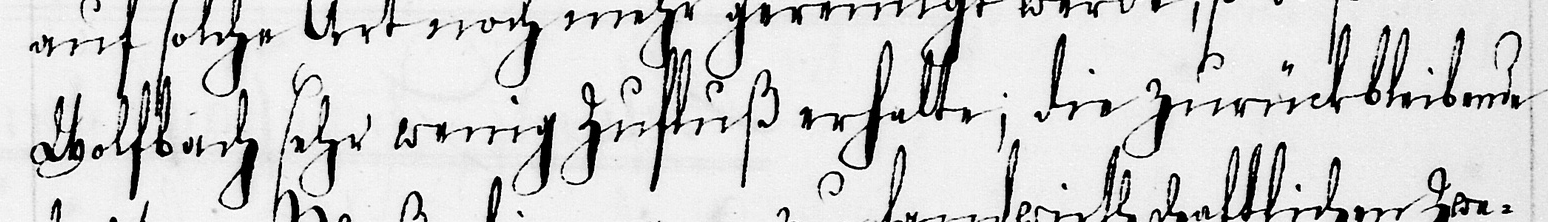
Wolfbach sehr wenig Zufluß erhalte; die zurückbleibende
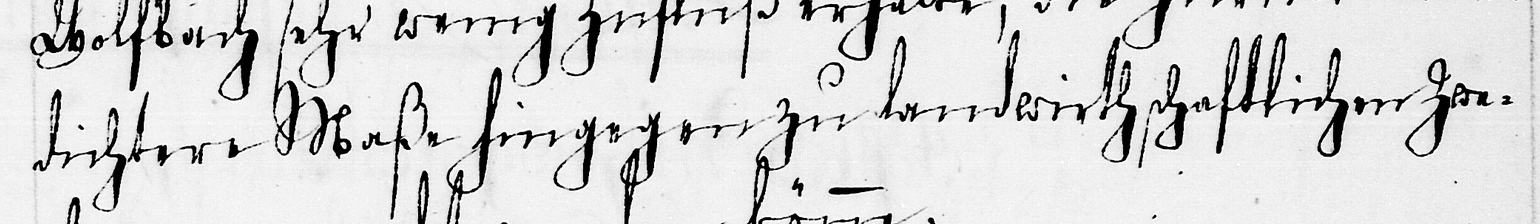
dichtere Maße hingegen zu landwirthschaftlichen Zwe¬
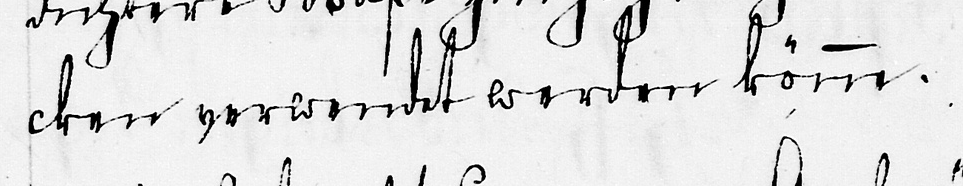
cken verwendet werden könne.
